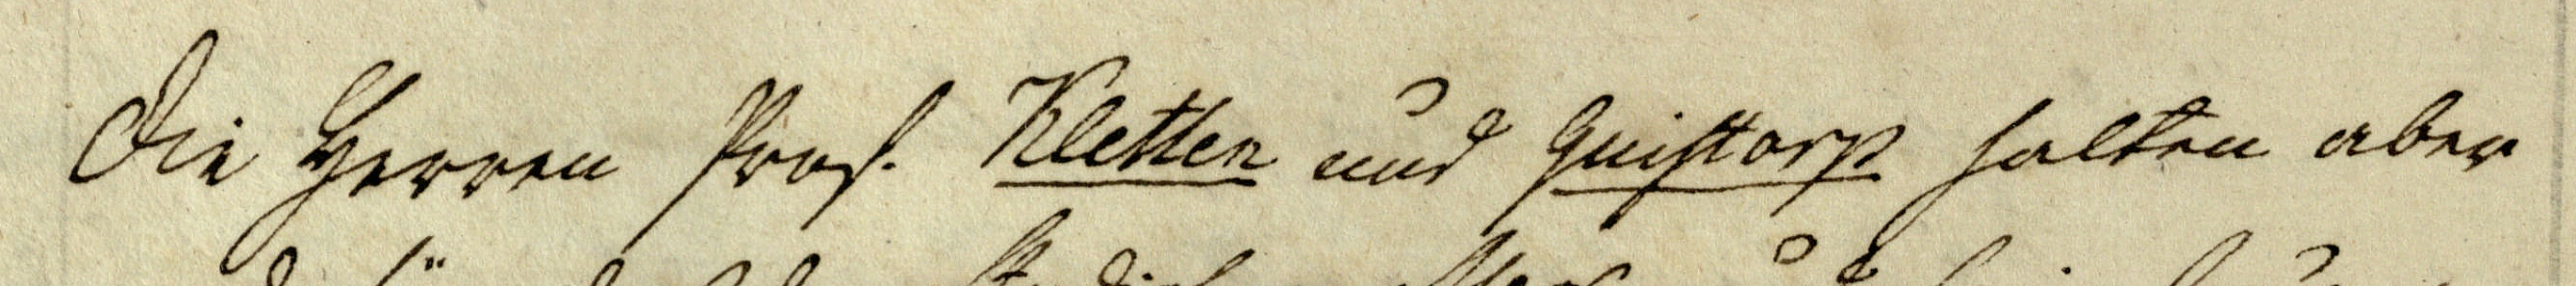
Die Herren Prof. Kletten und Quistorp halten aber
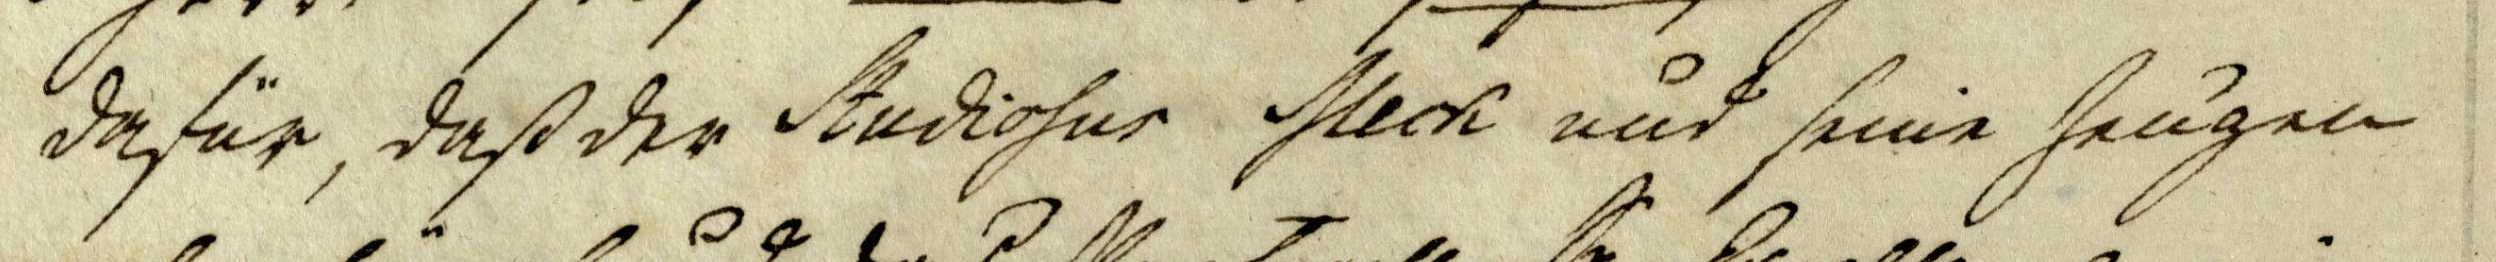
dafür, daß der Studiosus Meck und seine Zeugen
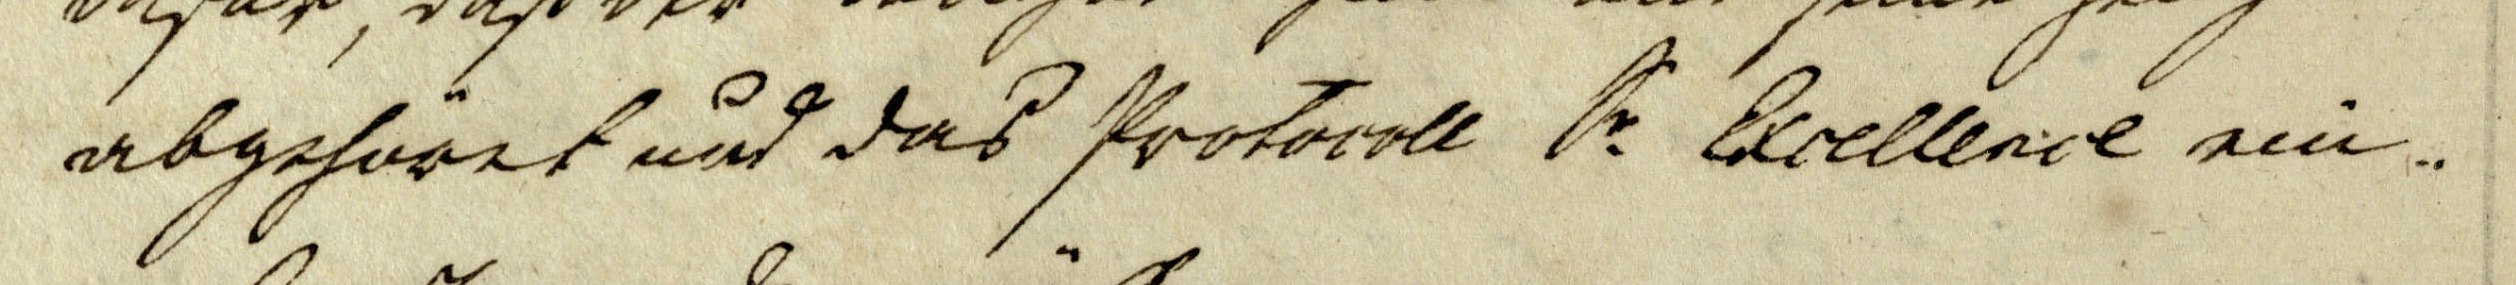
abgehöret und das Protocoll Sr Excellence ein¬
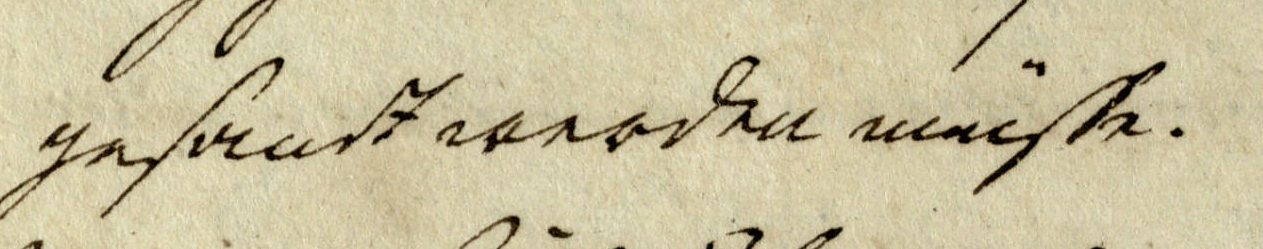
gesandt werden müsse.
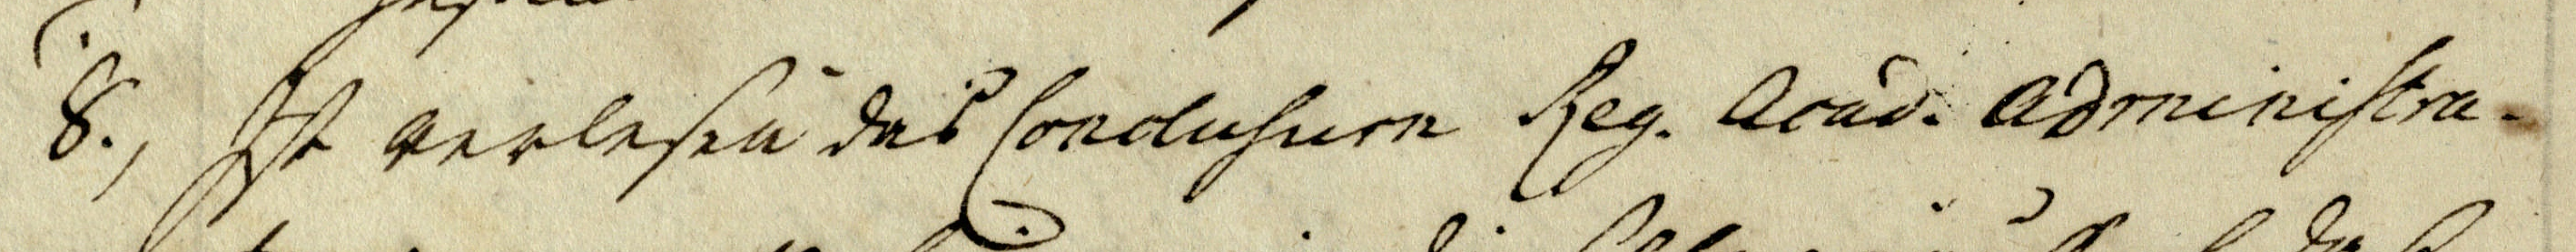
8., Ist verlesen das Conclusum Reg. Acad. Administra¬
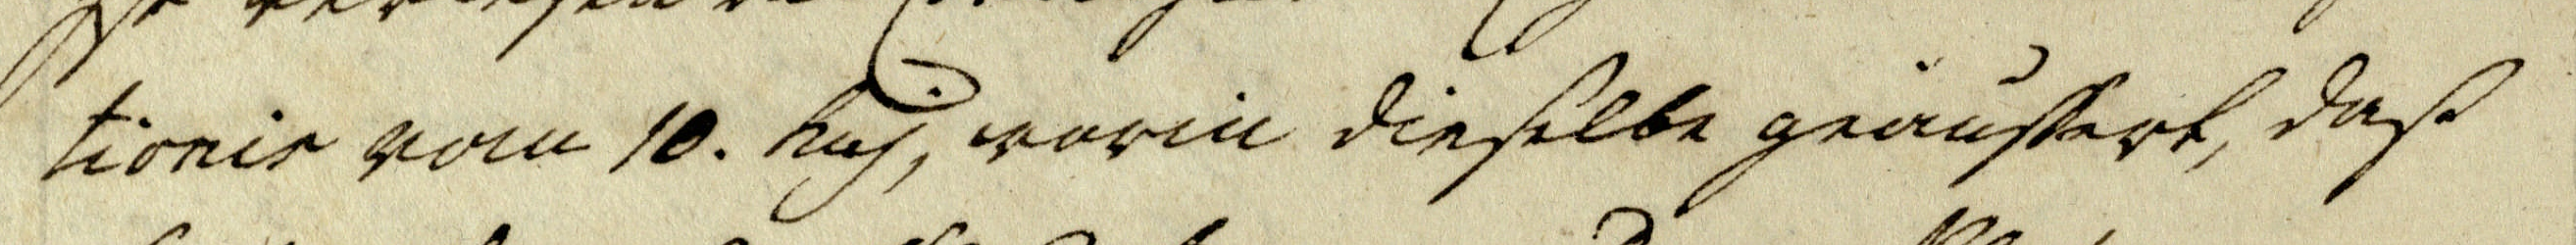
tionis vom 10. huj, worin dieselbe geäussert, daß
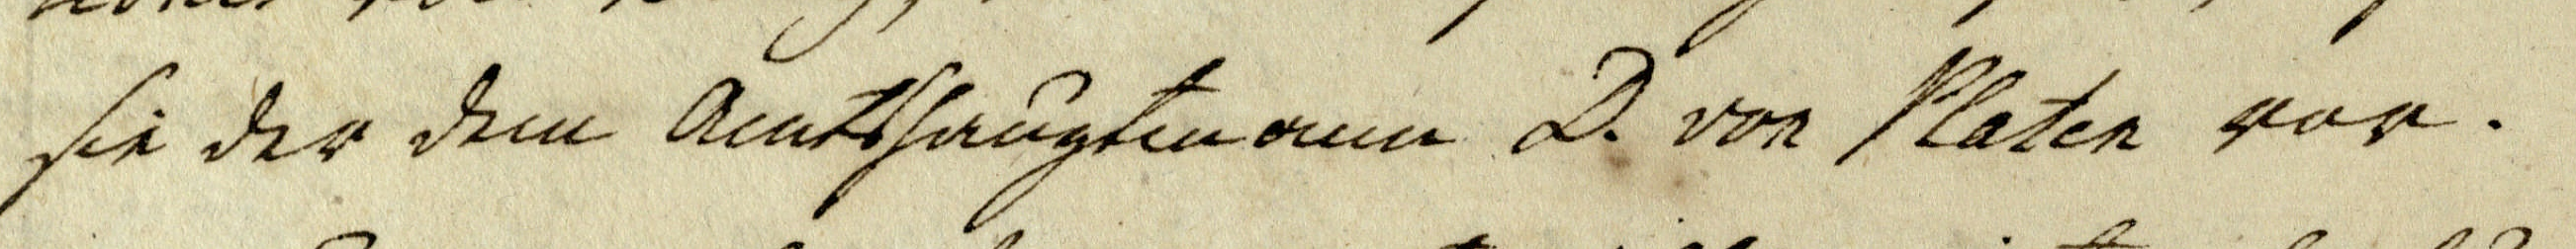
sie der dem Amtshauptmann D. von Platen vor¬
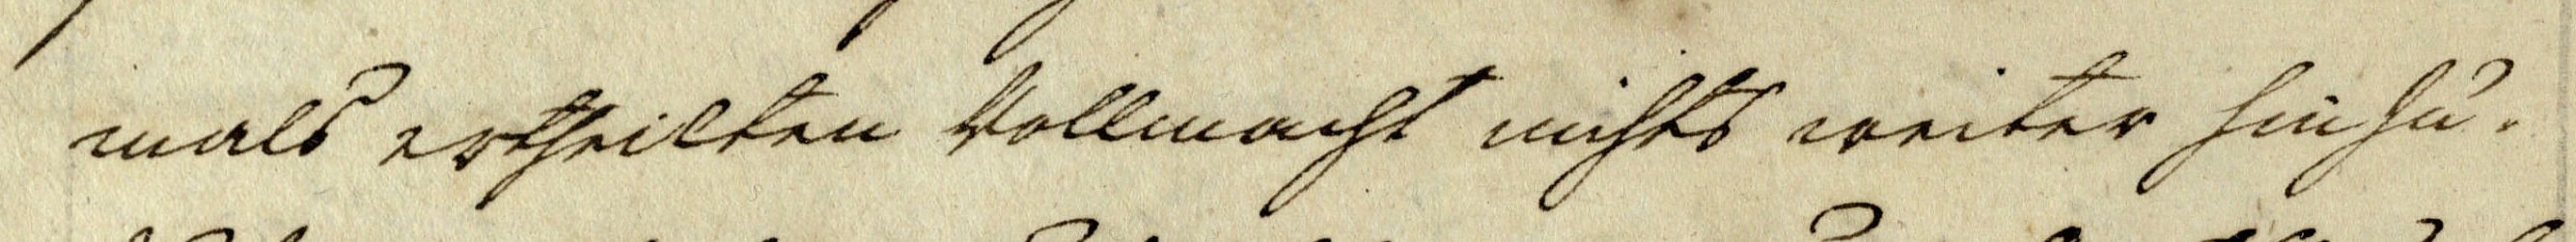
mals ertheilten Vollmacht nichts weiter hinzu¬
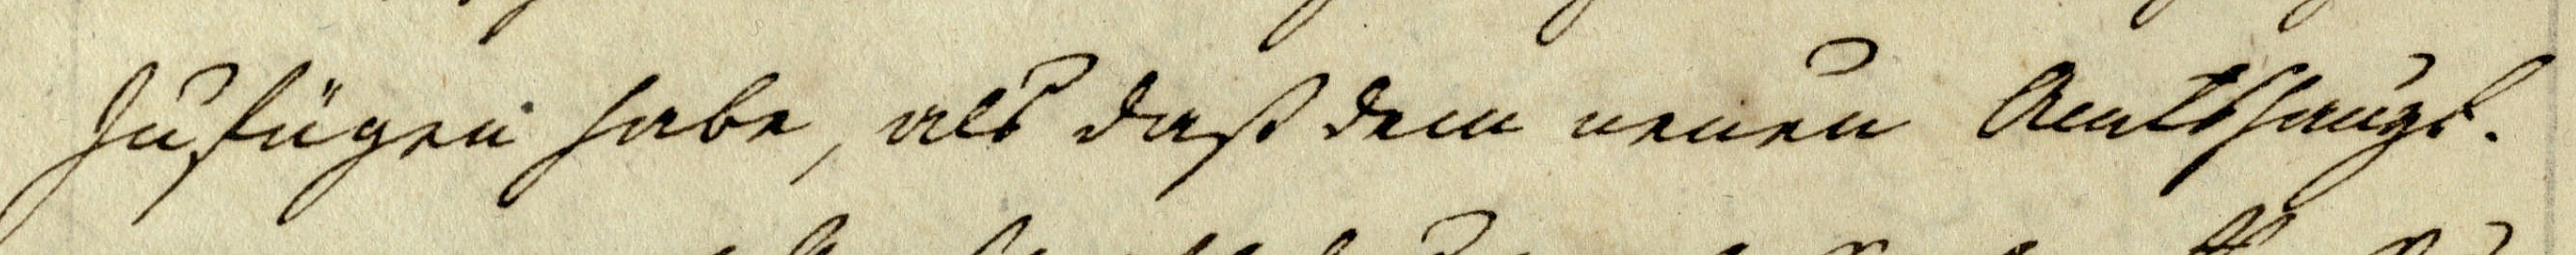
zufügen habe, als daß dem neuen Amtshaupt¬
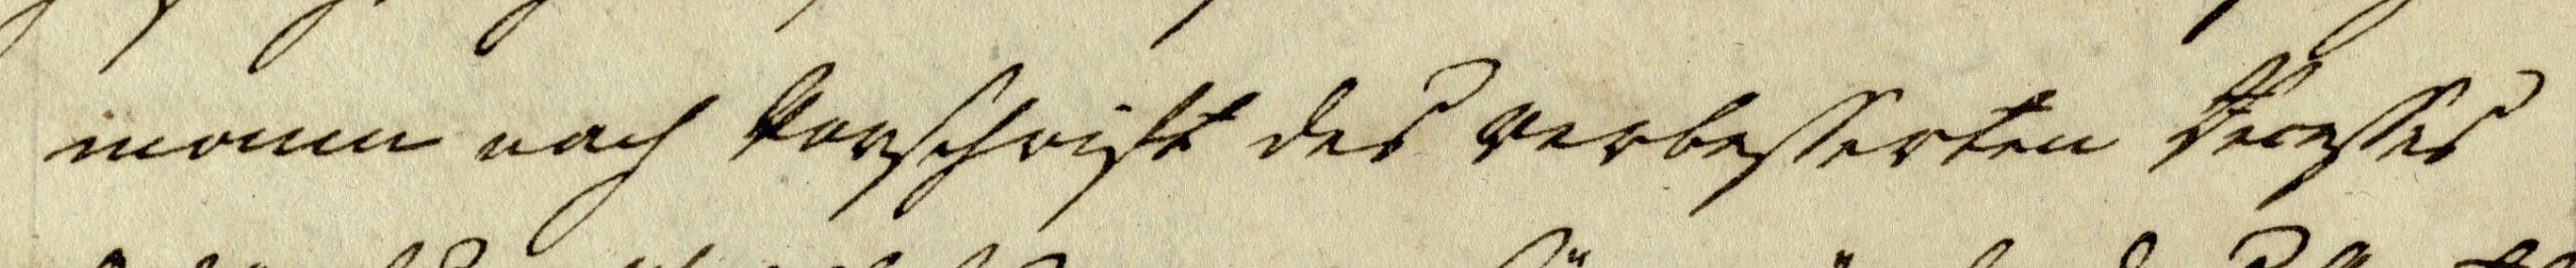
mann nach Vorschrift des verbesserten Recesses
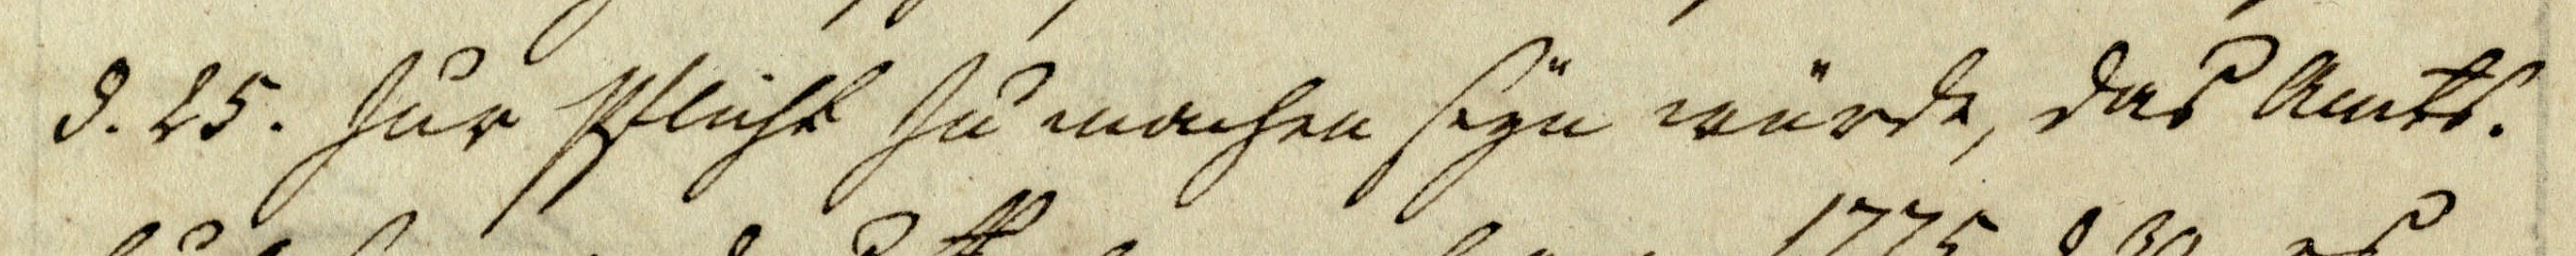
§. 25. zur Pflicht zu machen seÿn würde, das Amts¬
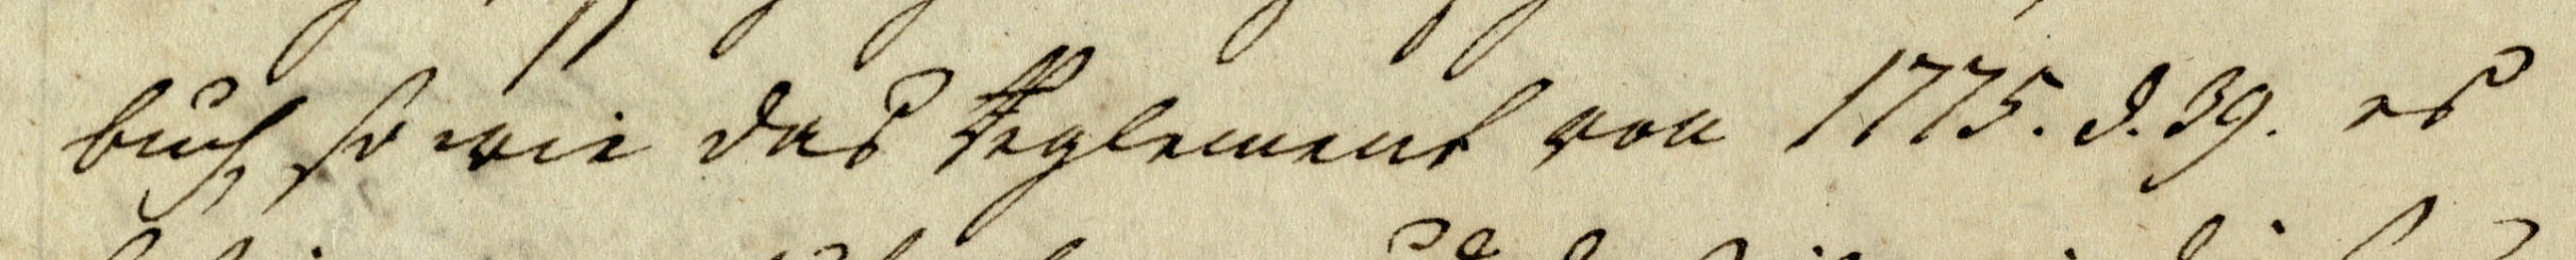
buch, so wie das Reglement von 1775. §. 39. es
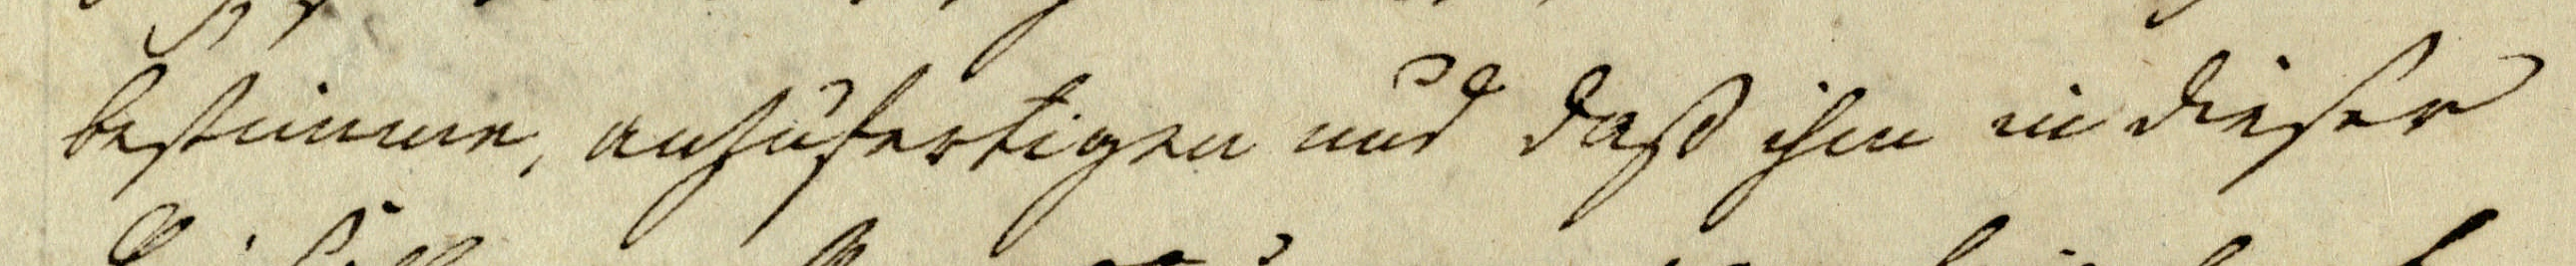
bestimme, anzufertigen und daß ihm in dieser
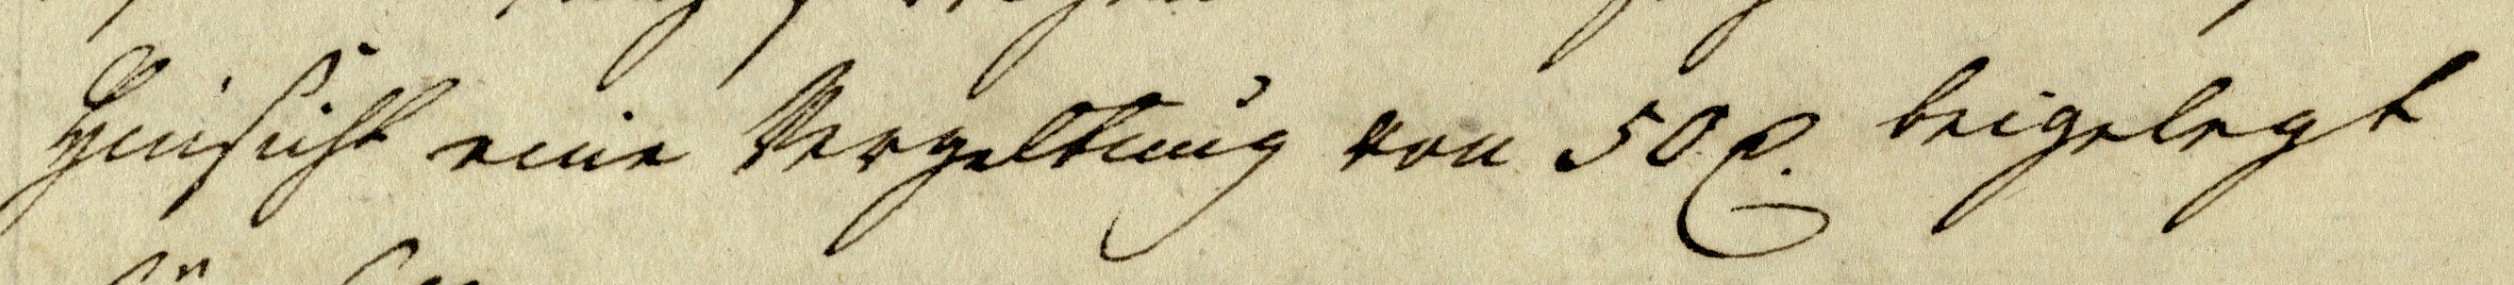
Hinsicht eine Vergeltung von 50 l. beigelegt
